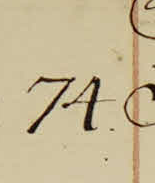74.
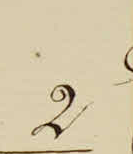2
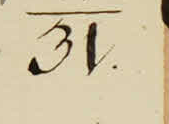31.
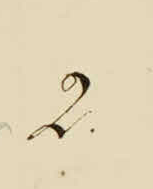2.
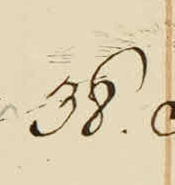38.
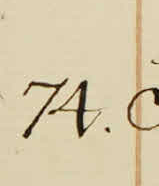74.
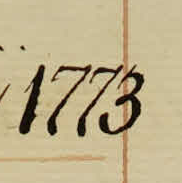1773
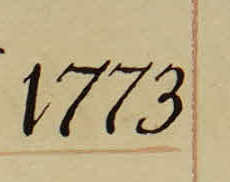1773
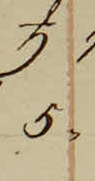5
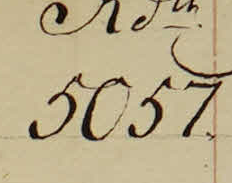5057
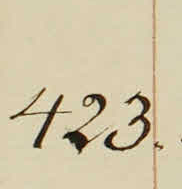423
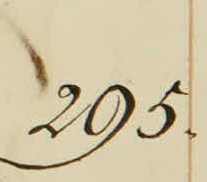295
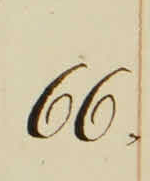66
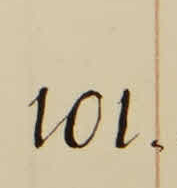101
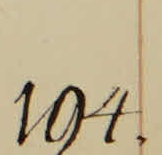194
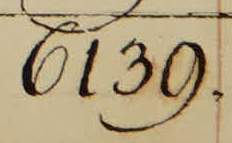6139
